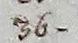36
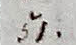51
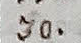30
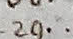29
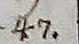47
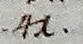41
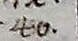40
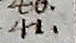41
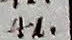41
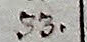53
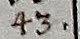43
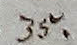35
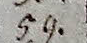59
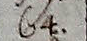64
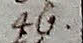46
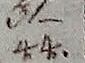44
